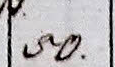50.
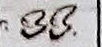33.
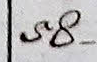58
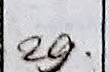29.
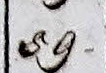59
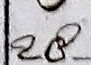28
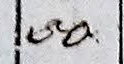50.
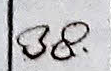38.
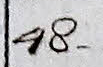48
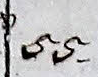55
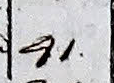41.
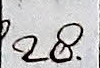28.
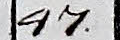47.
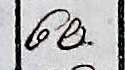60.
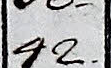42.
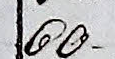60
